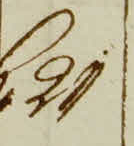21
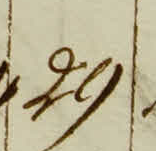29
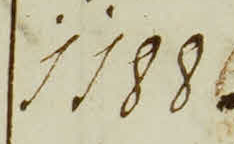1188
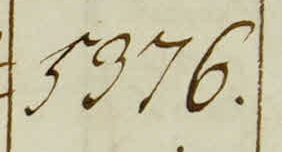5376.
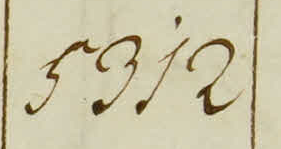5312
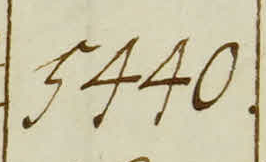5440
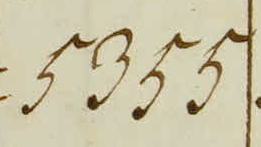5355
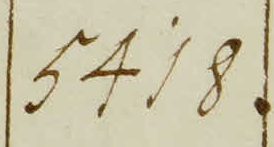5418
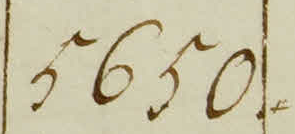5650
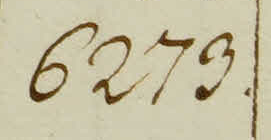6273
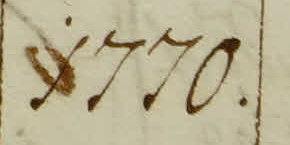1770.
